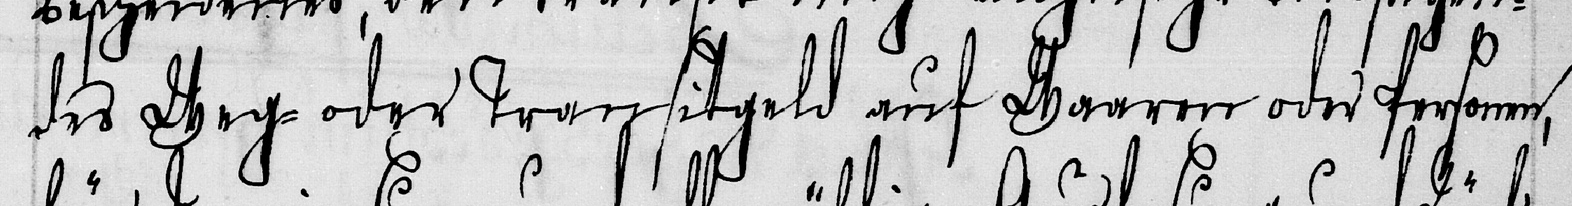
des Weg- oder Transitgeld auf Waaren oder Personen,
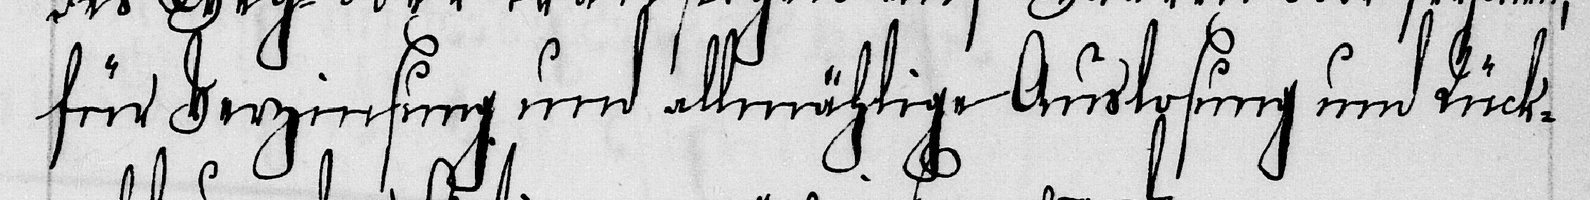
für Verzinsung und allmählige Auslosung und Rück¬
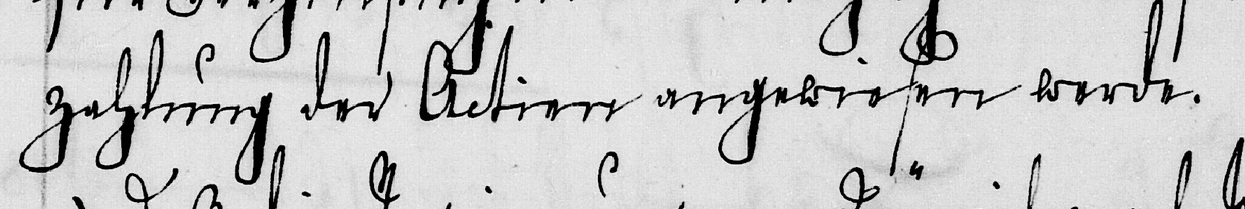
zahlung der Actien angewiesen werde.
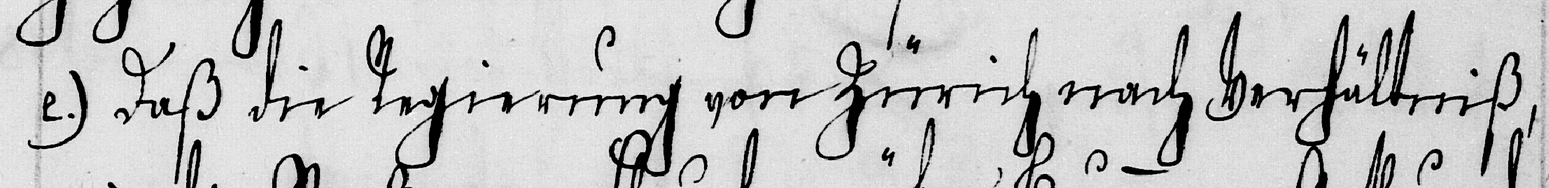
e.) Daß die Regierung von Zürich nach Verhältniß,
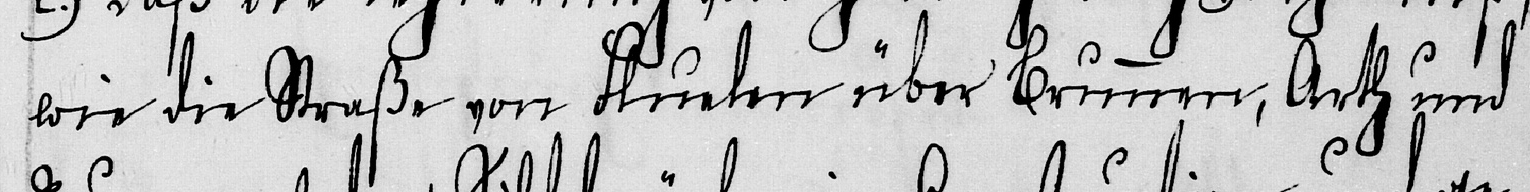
wie die Straße von Fluelen über Brunnen, Arth und
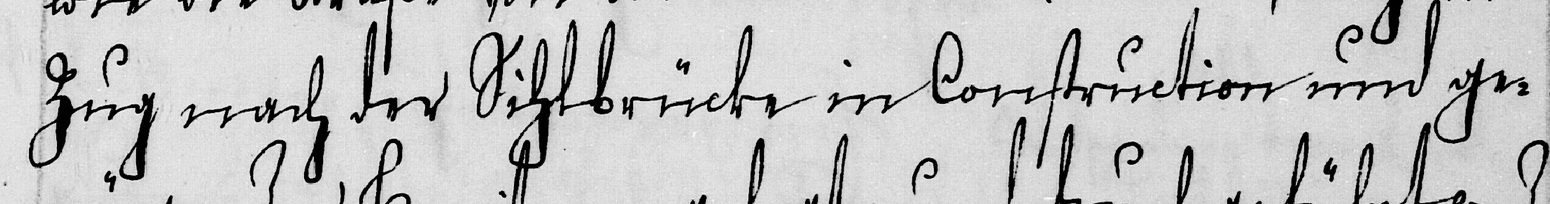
Zug nach der Sihlbrücke in Construction und ge¬
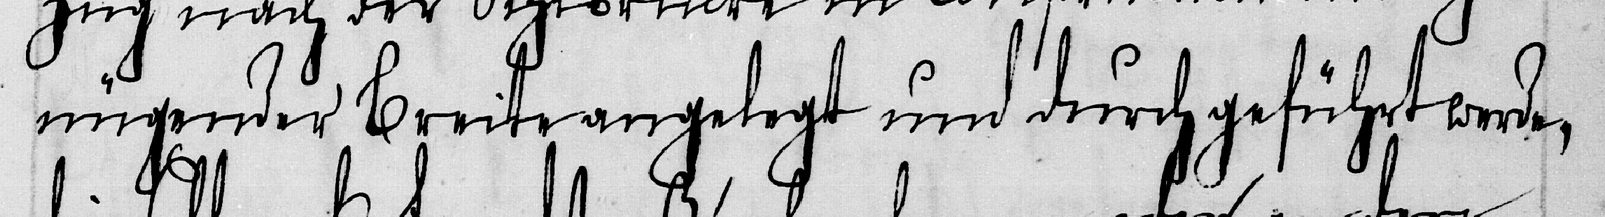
nügender Breite angelegt und durchgeführt werde,
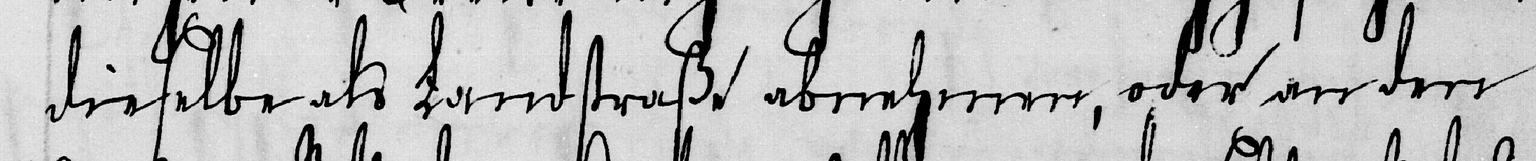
dieselbe als Landstraße abnehmen, oder an den
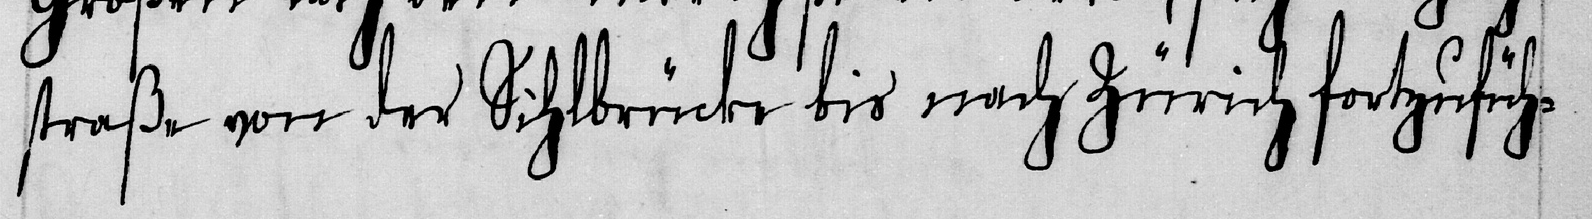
straße von der Sihlbrücke bis nach Zürich fortzufüh¬
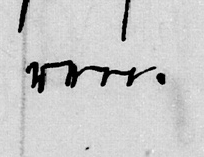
ren.
